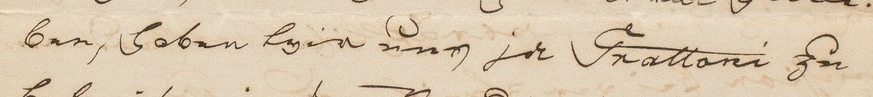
ben, haben wir uns ja Grattoni zu
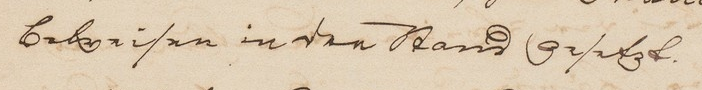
beweisen in den Stand gesetzt.
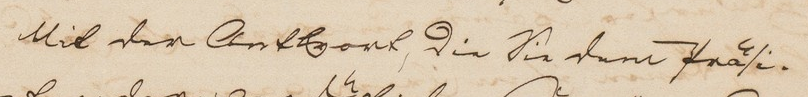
Mit der Antwort, die Sie dem Präsi-
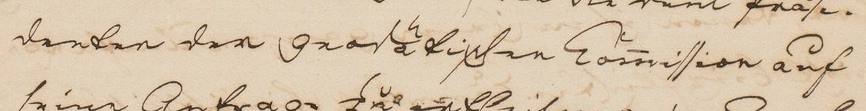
denten der geodätischen Commission auf
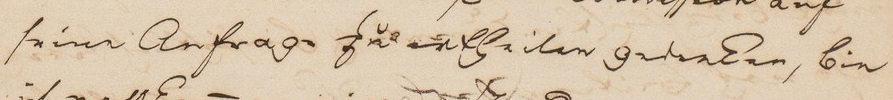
seine Anfrage zu ertheilen gedenken, bin
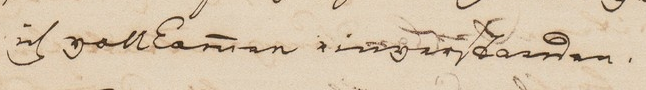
ich vollkommen einverstanden.
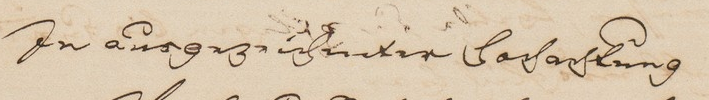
In ausgezeichneter Hochachtung
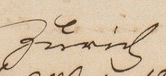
Zürich
